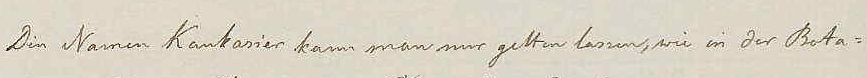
Den Namen Kaukasier kann man nur gelten lassen, wie in der Bota-
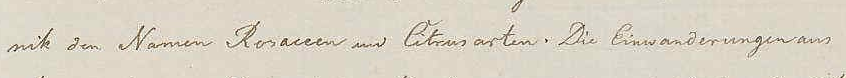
nik den Namen Rosaceen um Citrusarten. Die Einwanderungen aus
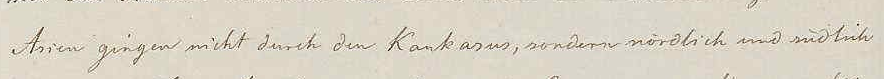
Asien gingen nicht durch den Kaukasus, sondern nördlich und südlich
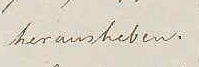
herausheben.
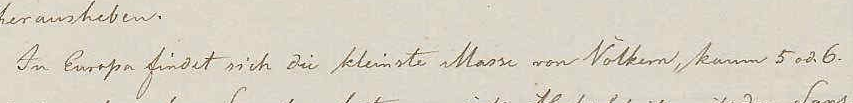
In Europa findet sich die kleinste Masse von Völkern, kaum 5 od. 6.
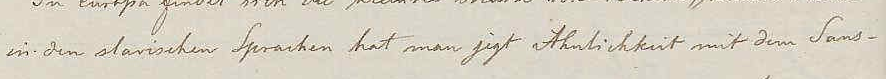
n den slavischen Sprachen hat man jezt Ähnlichkeit mit dem Sans-
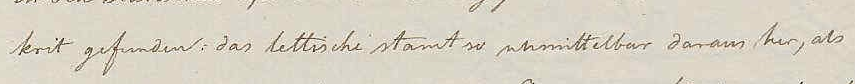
krit gefunden: das lettische stamt so unmittelbar daraus her, als
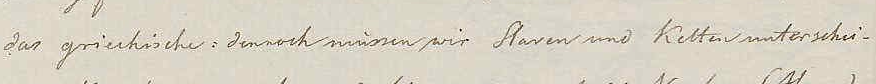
das griechische: dennoch müssen wir Slaven und Kelten unterschei-
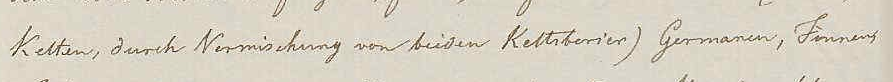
Kelten, durch Vermischung von beiden Keltiberier) Germanen, Finnen,
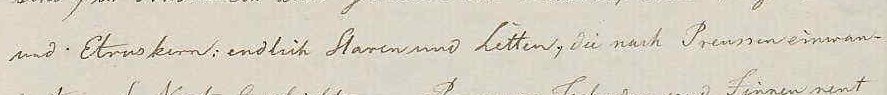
und Etruskern: endlich Slaven und Letten, die nach Preussen einwan-
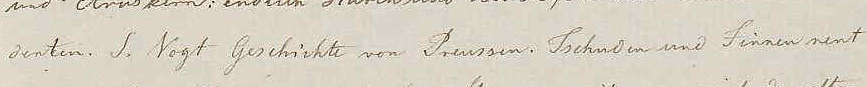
derten. S. Vogt Geschichte von Preussen. Tschuden und Finnen nent
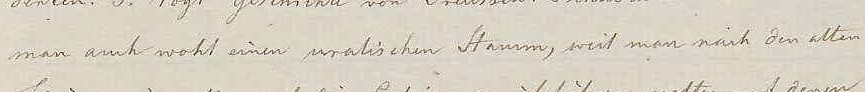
man auch wohl einen uralischen Stamm, weil man nach den alten
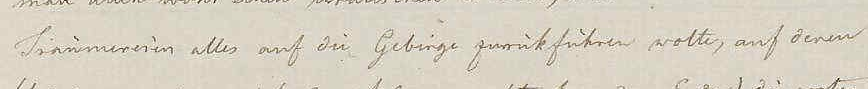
Träumereien alles auf die Gebirge zurükführen wolte, auf denen
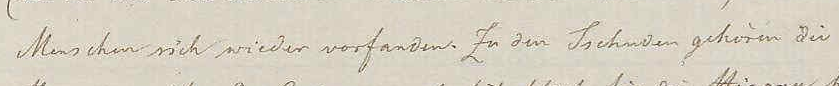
Menschen sich wieder vorfanden. Zu den Tschuden gehören die
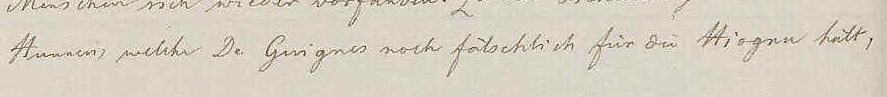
Hunnen, welche De Guignes noch fälschlich für die Hiognu hält,
